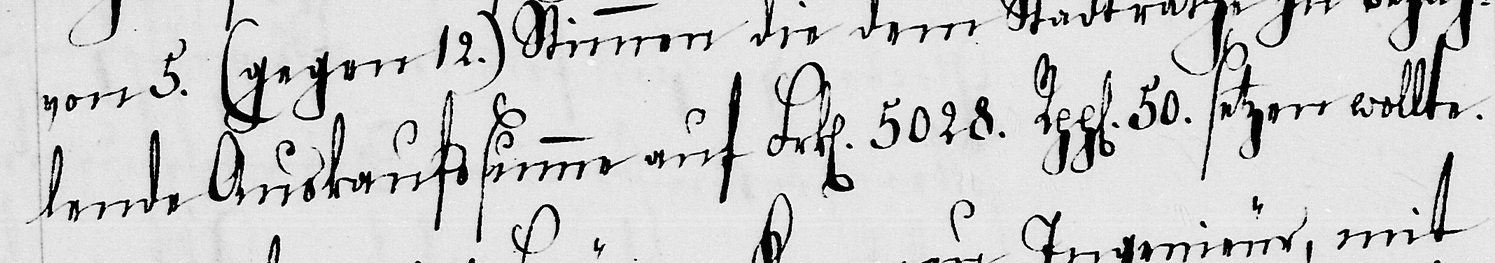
lende Auskaufssumme auf Frk[en]. 5028. Rpp[en]. 50. setzen
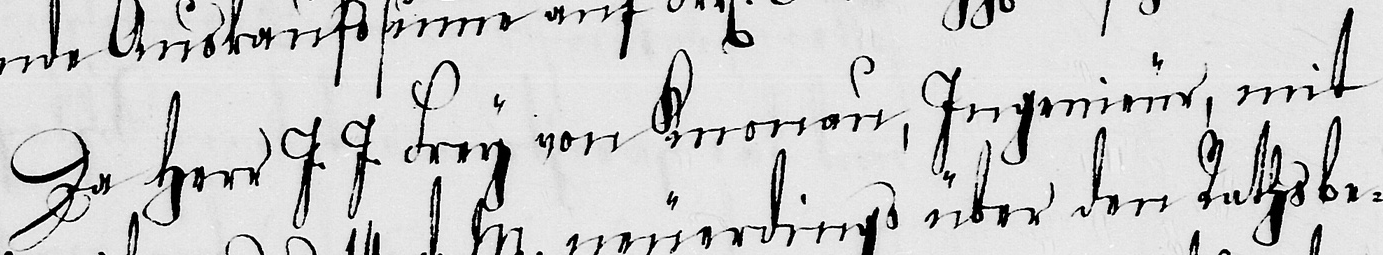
Da Herr J. J. Frey von Knonau, Ingenieur, mit
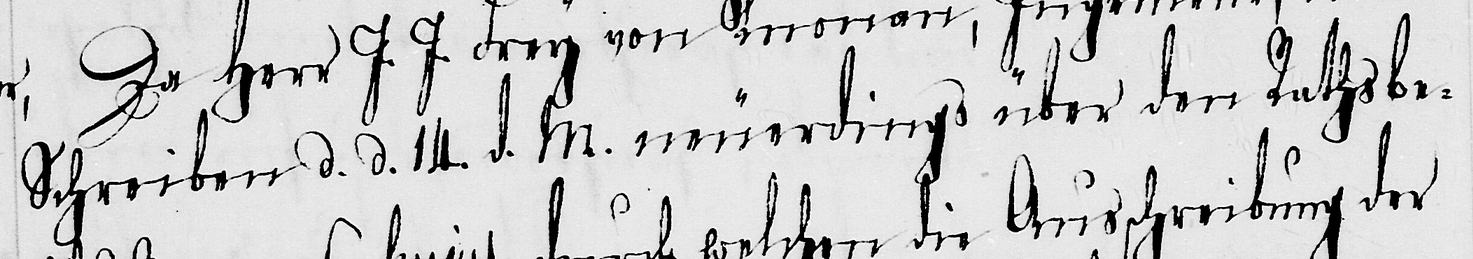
Schreiben d.d. 14. d. M. neuerdings über den Rathsbe¬
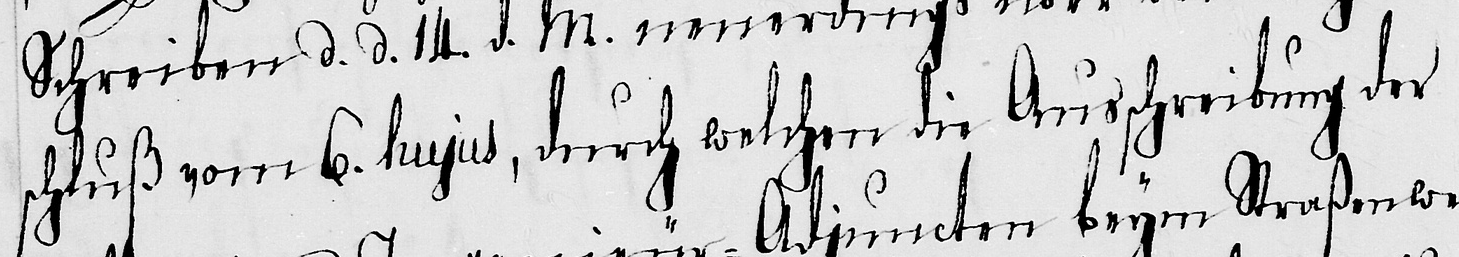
schluß vom 6. hujus, durch welchen die Ausschreibung der
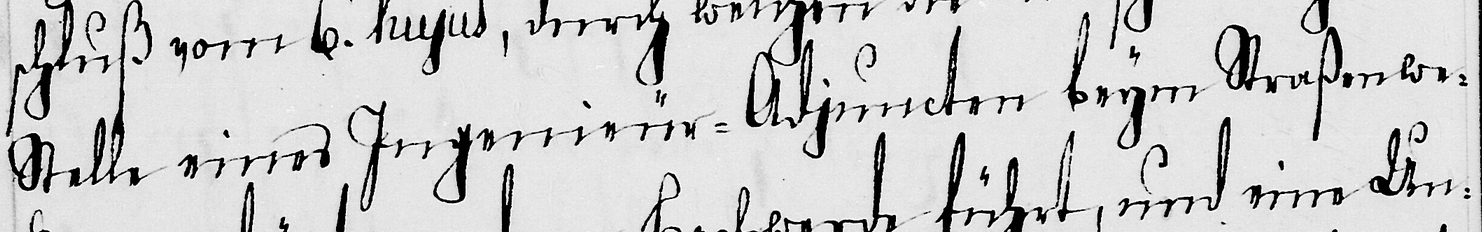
Stelle eines Ingenieur-Adjuncten beym Straßenwe¬
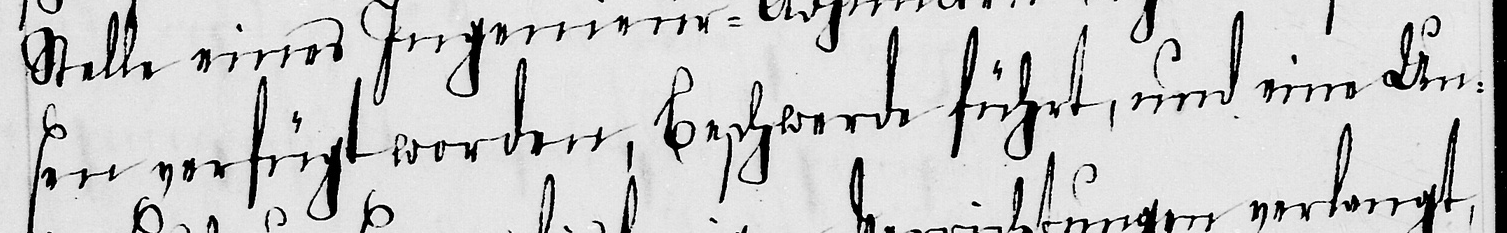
sen verfügt worden, Beschwerde führt, und eine Un¬
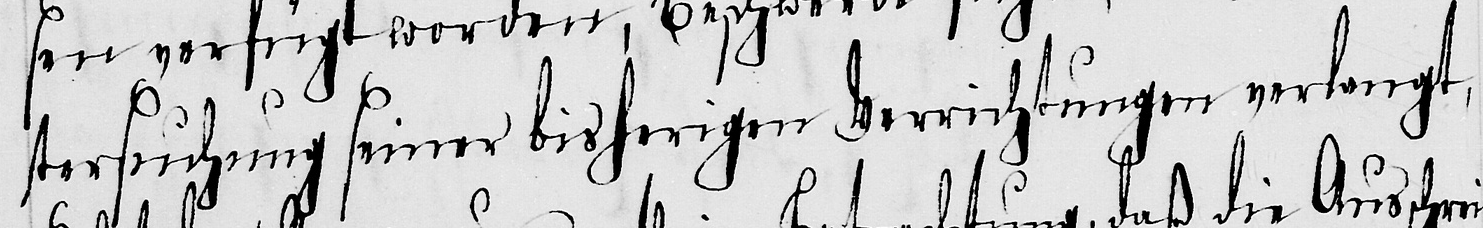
tersuchung seiner bisherigen Verrichtungen verlangt,
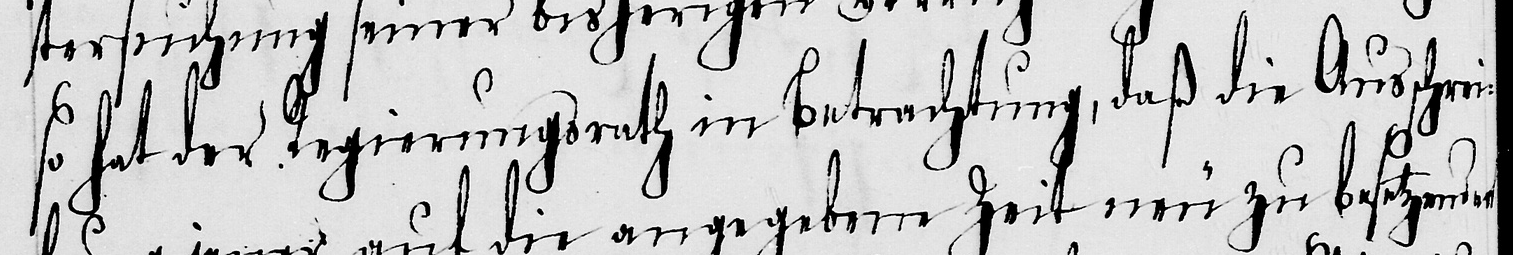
so hat der Regierungsrath in Betrachtung, daß die Ausschr¬
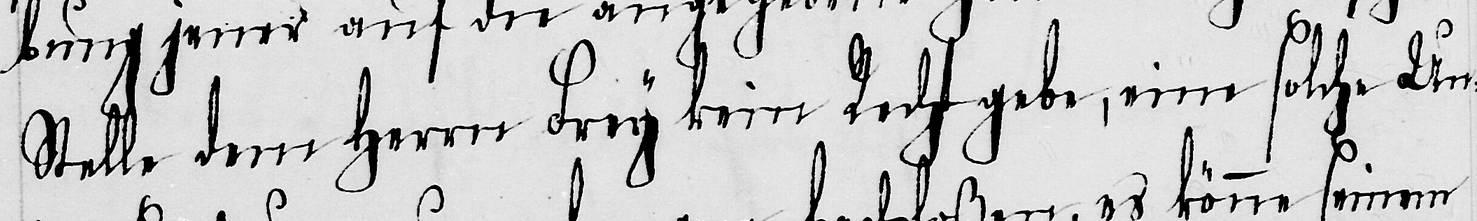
Stelle dem Herrn Frey kein Recht gebe, eine solche Un¬
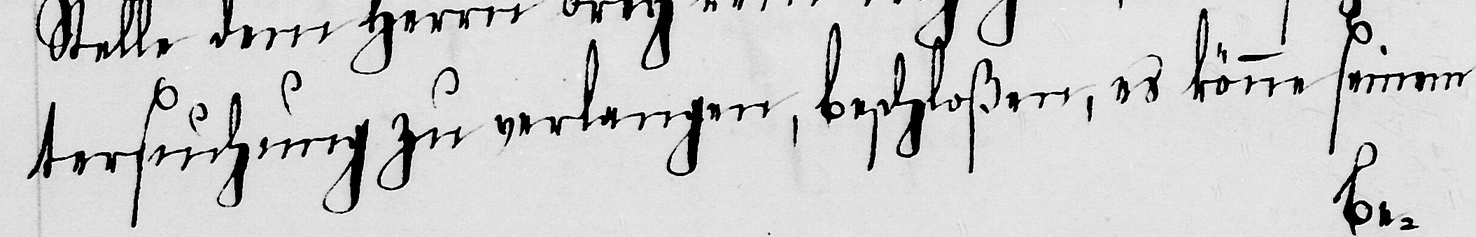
tersuchung zu verlangen, beschloßen, es könne seinem
